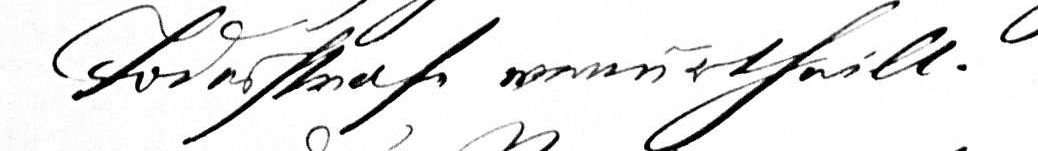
Todesstrafe verurtheilt.
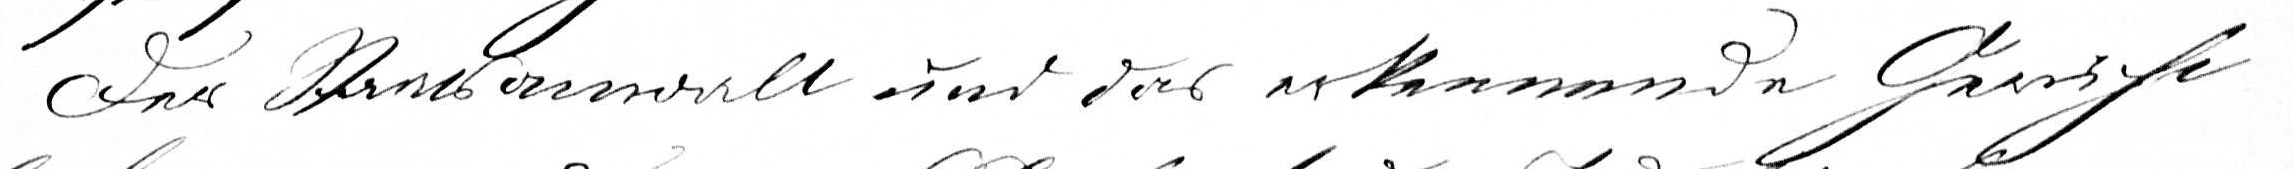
Der Staatsanwalt und das erkennende Gericht
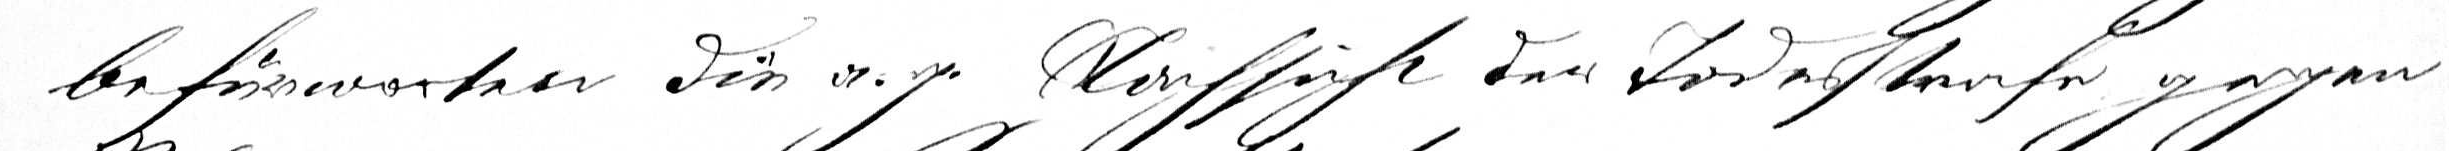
befürworten die a. g. Nachsicht der Todesstrafe gegen
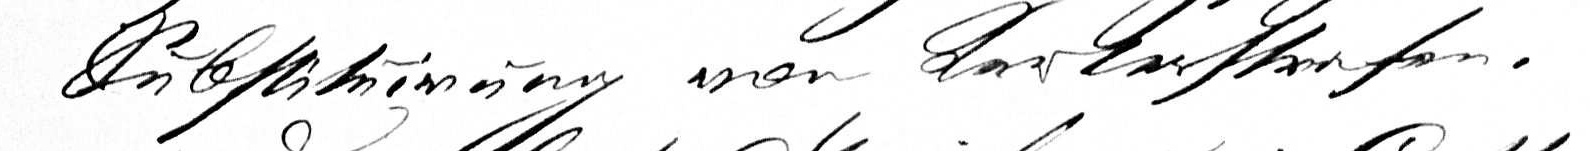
Substituirung von Kerkerstrafen.
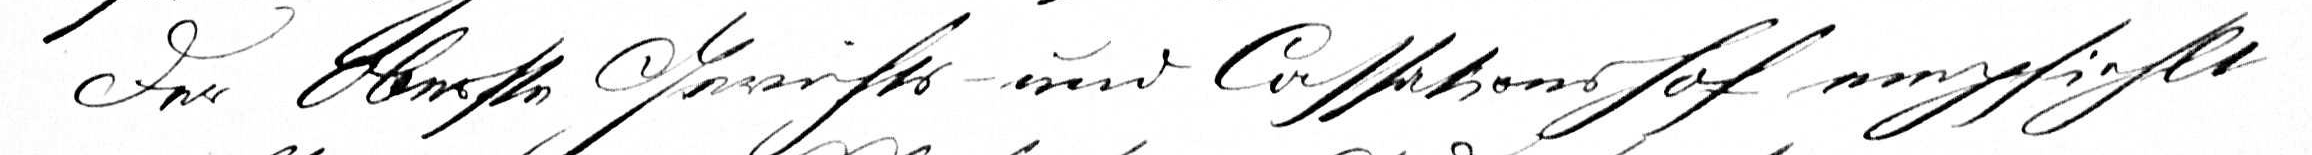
Der Oberste Gerichts- und Cassationshof empfiehlt
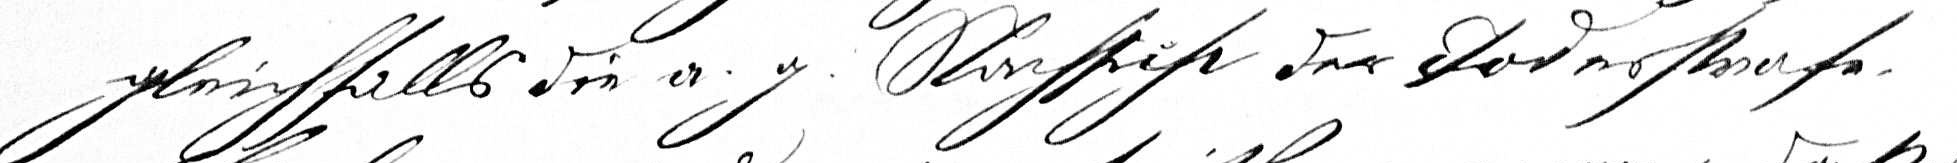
gleichfalls die a. g. Nachsicht der Todesstrafe.
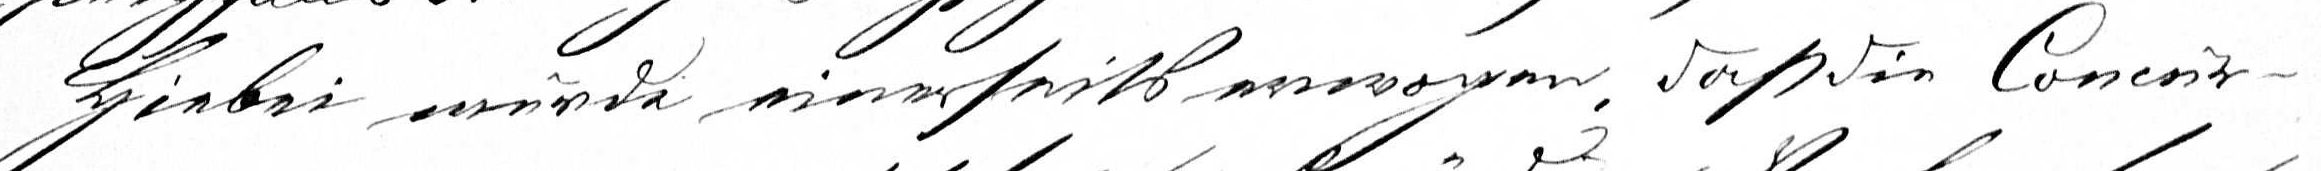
Hiebei wurde einerseits erwogen, daß die Concur¬
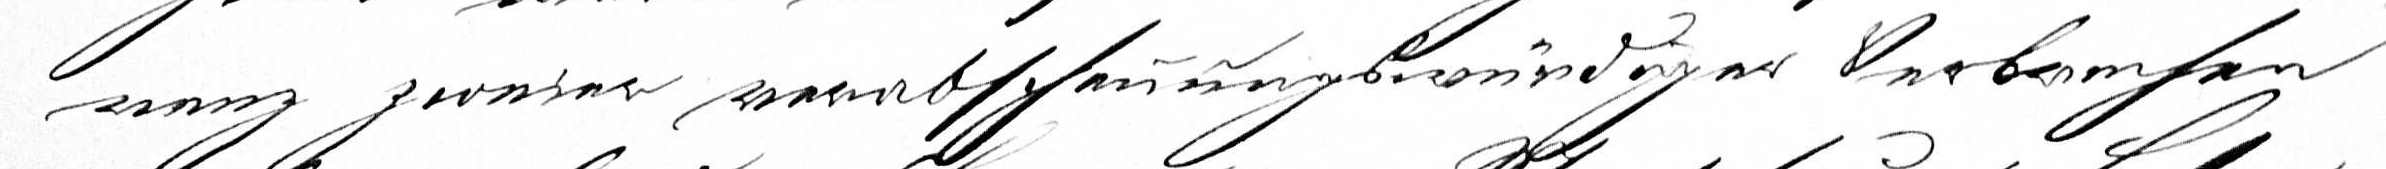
renz zweier verabscheuungswürdiger Verbrechen
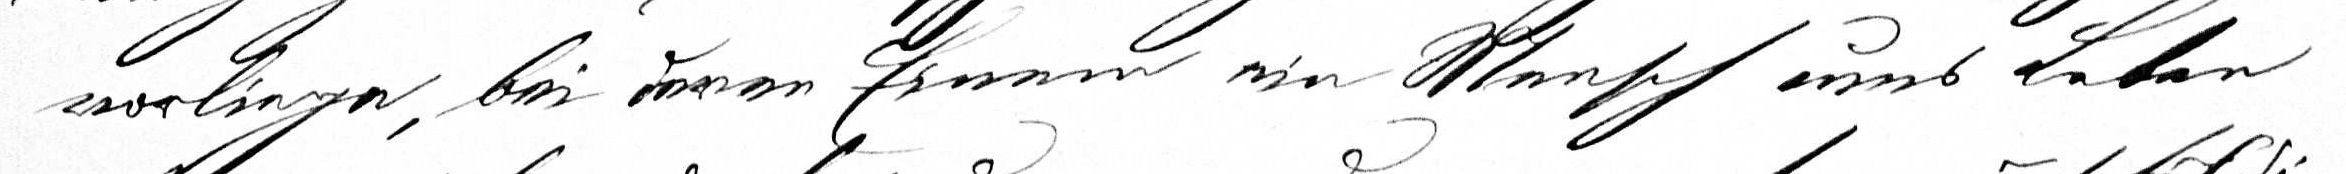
vorliege, bei deren Einem ein Mensch ums Leben
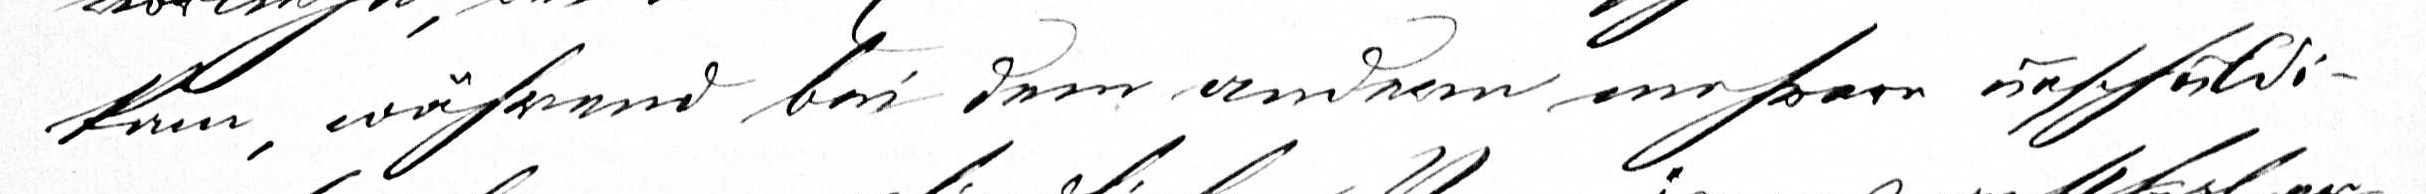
kam, während bei dem andern mehrere unschuldi¬
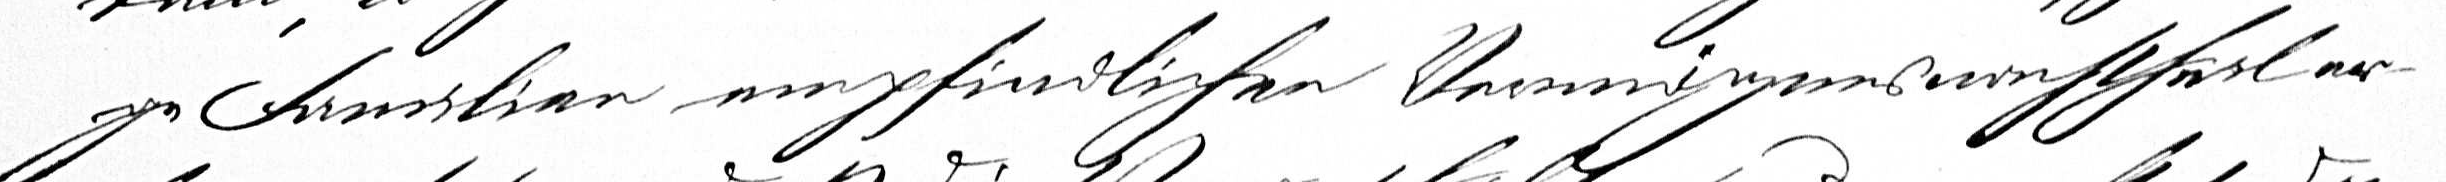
ge Familien empfindlichen Vermögensxx er¬
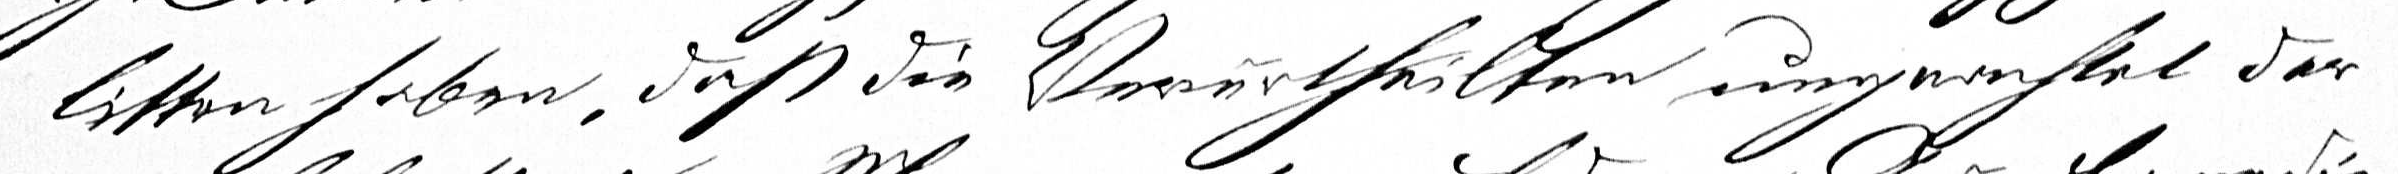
litten haben, daß die Verurtheilten ungerechtet der
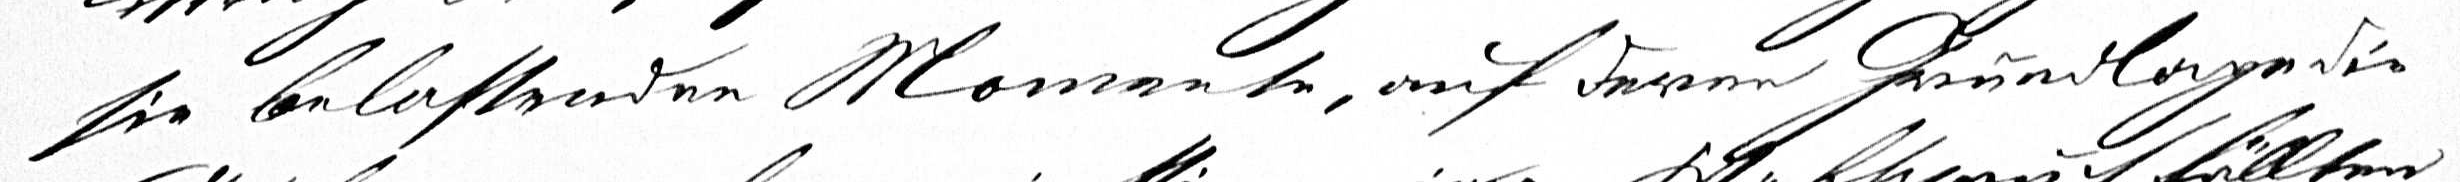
sie belastenden Momente, auf deren Grundlage die
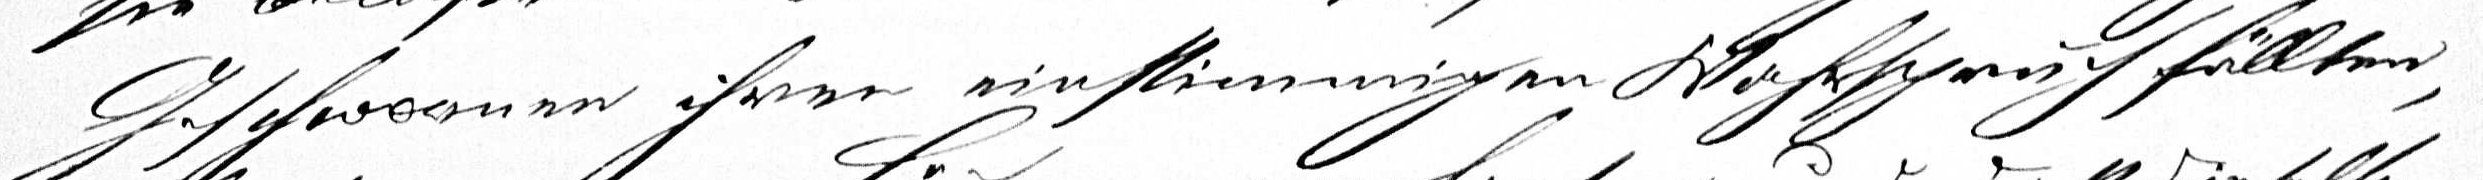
Geschwornen ihrer einstimmigen Wahrspruch fällten,
